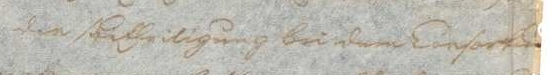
der Betheiligung bei dem Consortium
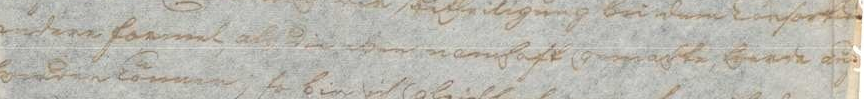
eine andere Formel, als die eben namhaft gemachte, werde aufge-
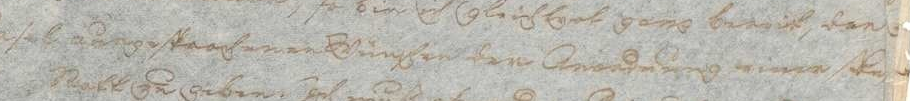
Basel ausgesprochenen Wünschen der Anordnung einer Bespre-
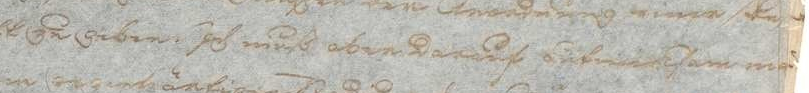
Statt zu geben. Ich muß aber darauf aufmerksam machen
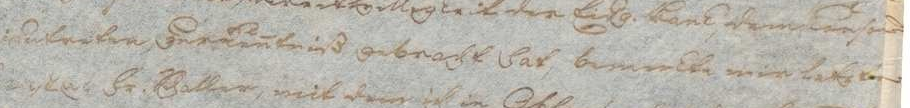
beizutreten, zur Kenntniß gebracht hat,bemerkte mir letzen
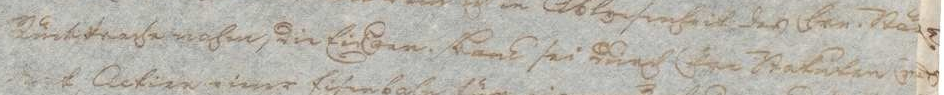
Rücksprache nahm, die Eidgen. Bank sei durch ihre Statuten verhin-
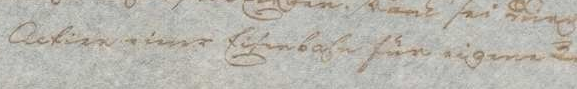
Actien einer Eisenbahn für eigene
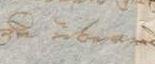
zu übernehmen,
